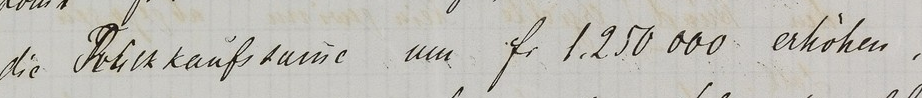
die Rückkaufssumme um Fr. 1.250 000 erhöhen.
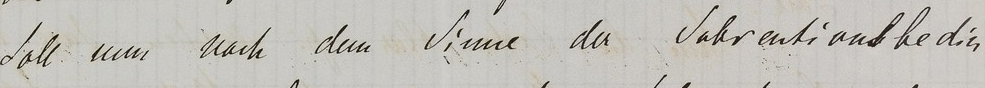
Soll nun nach dem Sinne der Subventionsbedin-
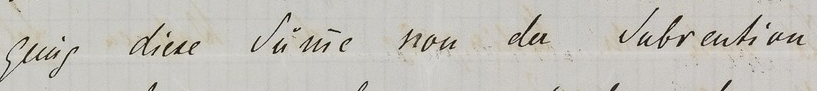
gung diese Summe von der Subvention
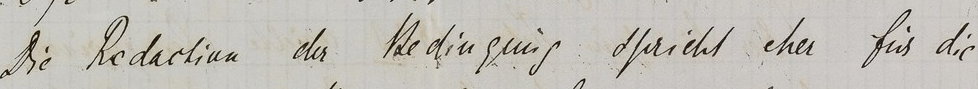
Die Redaction der Bedingung spricht eher für die
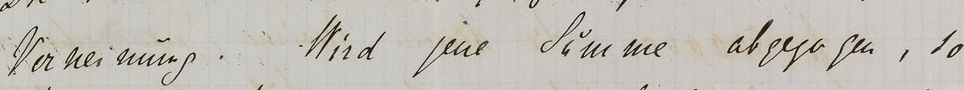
Verneinung. Wird jene Summe abgezogen, so
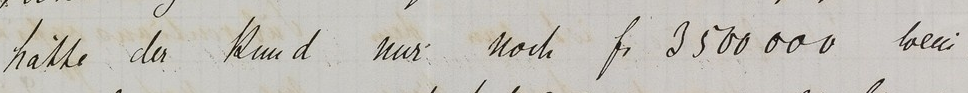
hätte der Bund nur noch Fr. 3 500 000 weni-
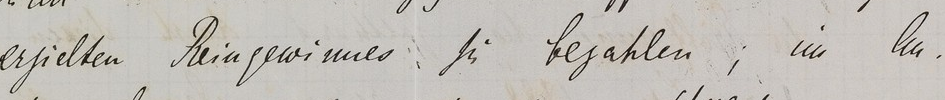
erzielten Reingewinnes zu bezahlen; im an-
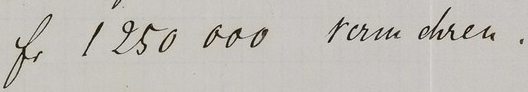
Fr. 1 250 000 vermehren.
